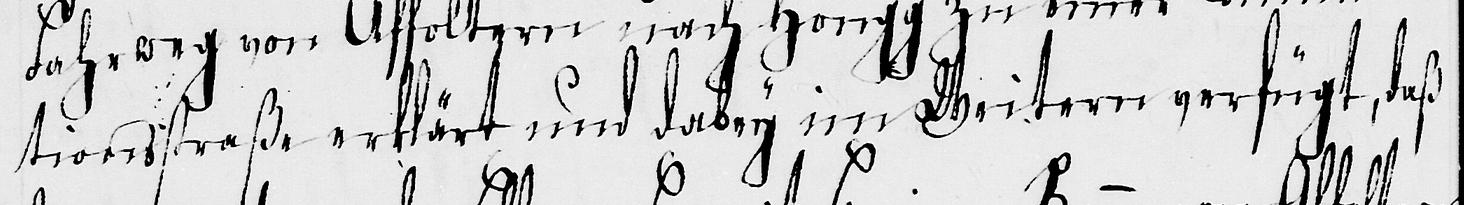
tionsstraße erklärt und dabey im Weitern verfügt, daß
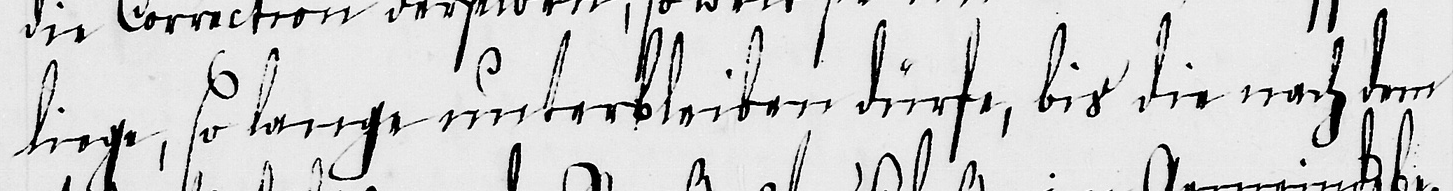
liege, so lange unterbleiben dürfe, bis die nach dem
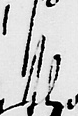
1.)
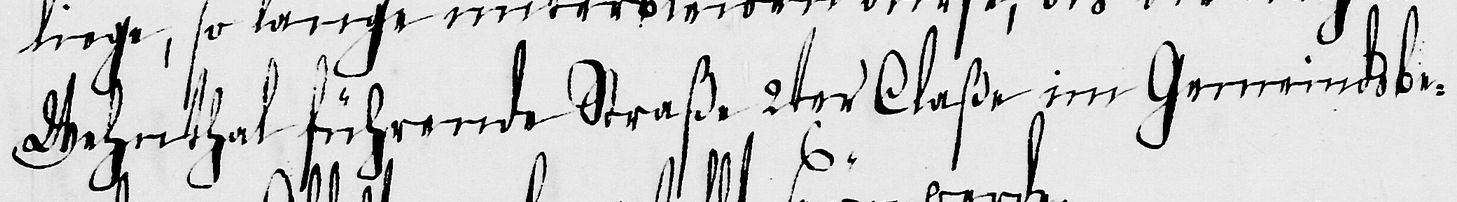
Wehnthal führende Straße 2ter Claße im Gemeindsbe¬
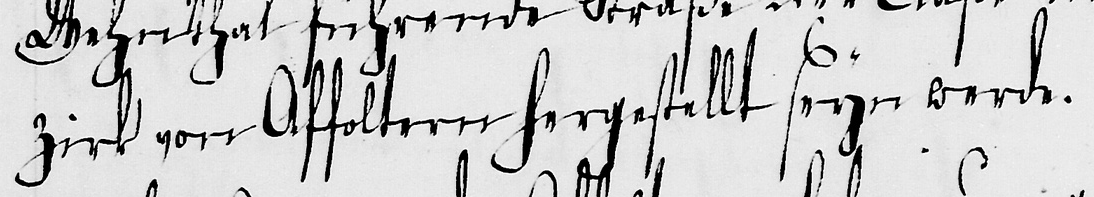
zirk von Affoltern hergestellt seyn werde.
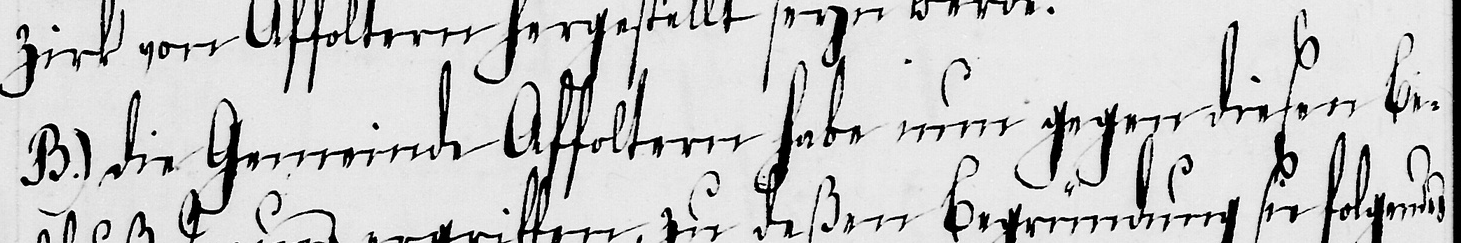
B.) die Gemeinde Affoltern habe nun gegen diesen Be¬
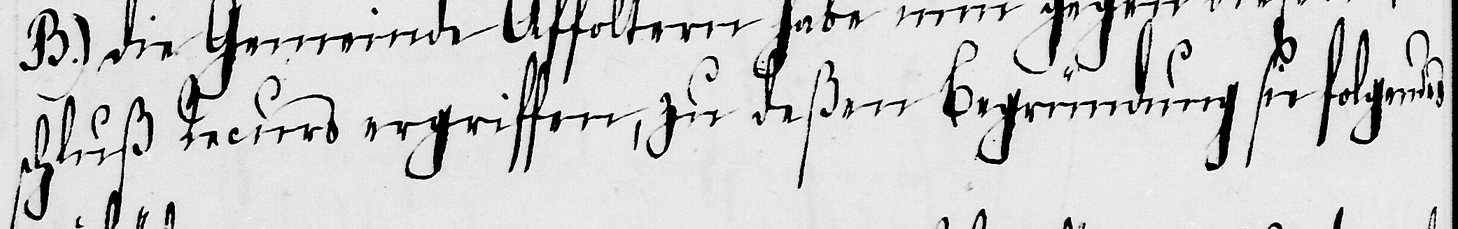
schluß Recurs ergriffen, zu deßen Begründung sie folgend¬
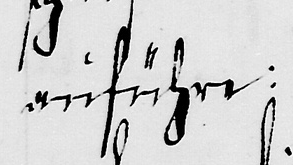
anführe:
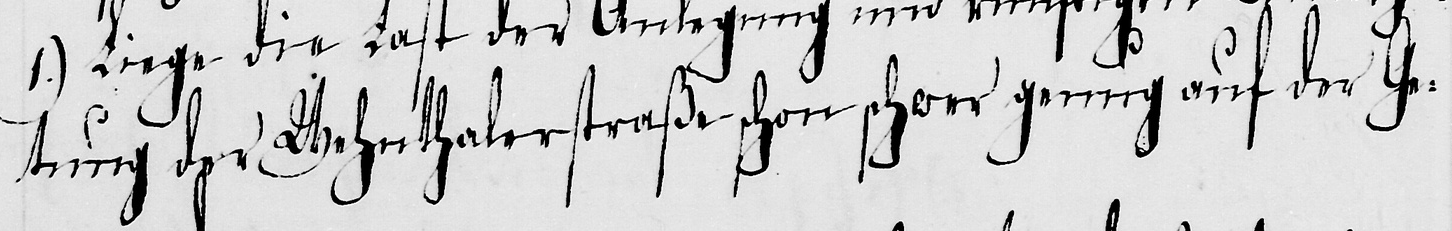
ltung der Wehntalerstraße schon schwer genug auf der Ge¬
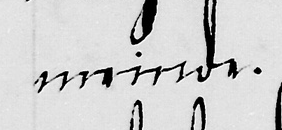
meinde.
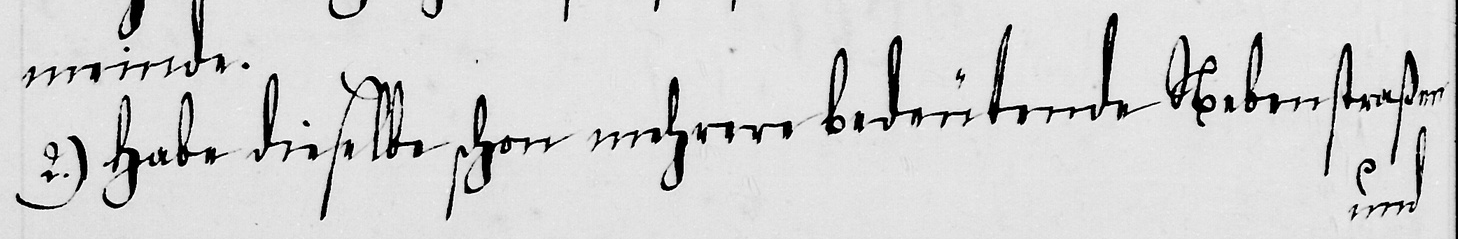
2.) Habe dieselbe schon mehrere bedeutende Nebenstraßen
